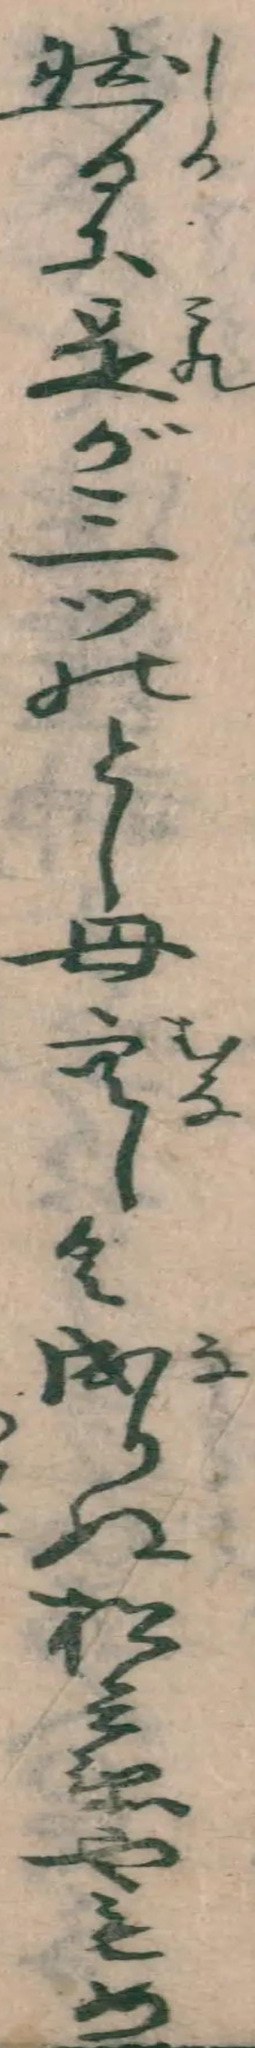然るに是が三つのとし母空しく成りぬ松兵衛やもめ
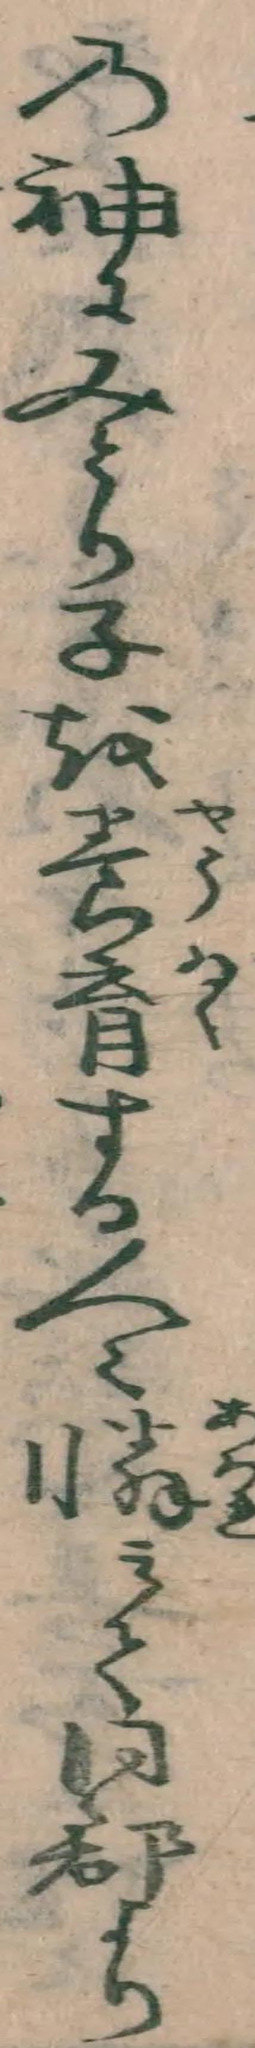の袖にみとり子を養育する人々憐みて同郡より
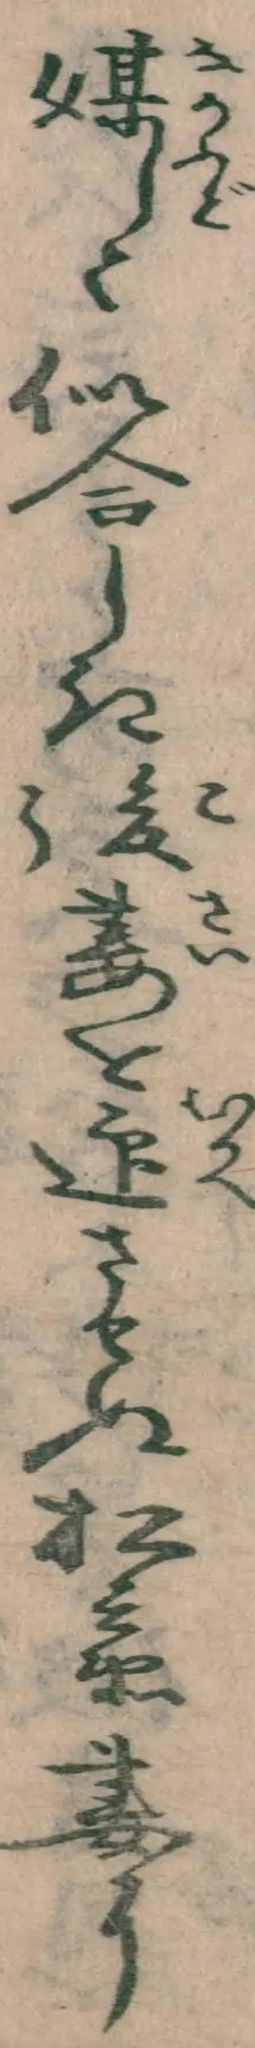媒して似合しき後妻を迎させぬ松兵衛妻に
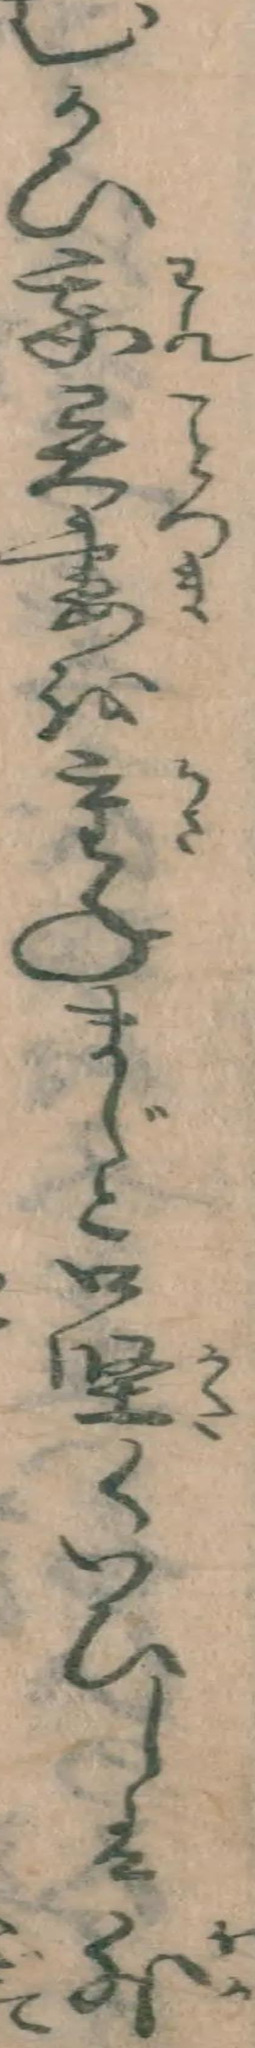むかひ我異妻を重ねまじと口堅くいひしは外
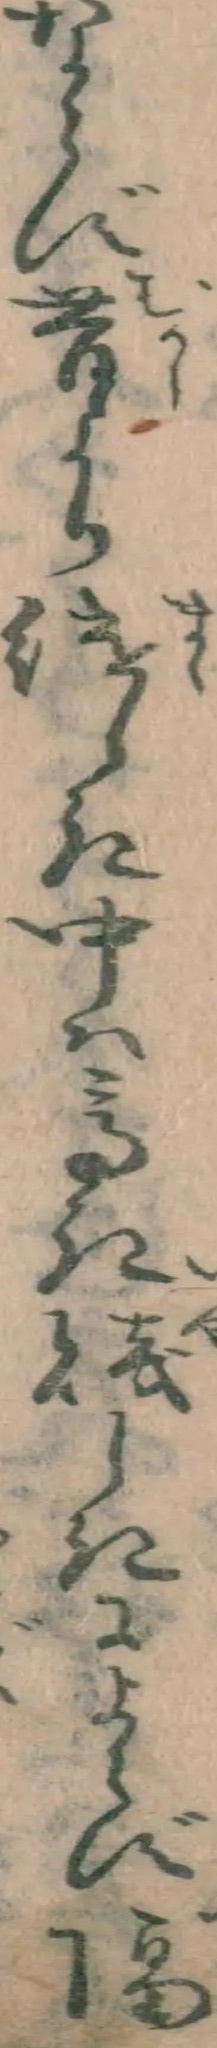ならず昔より継しき中は高き賎しきによらず隔
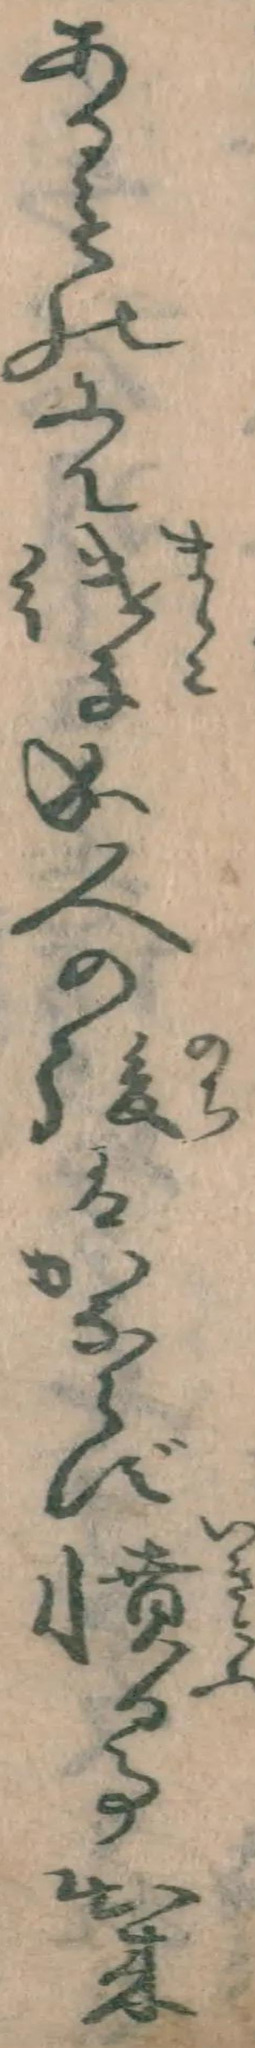あるものにて継子成人の後はかならず憤る事出来
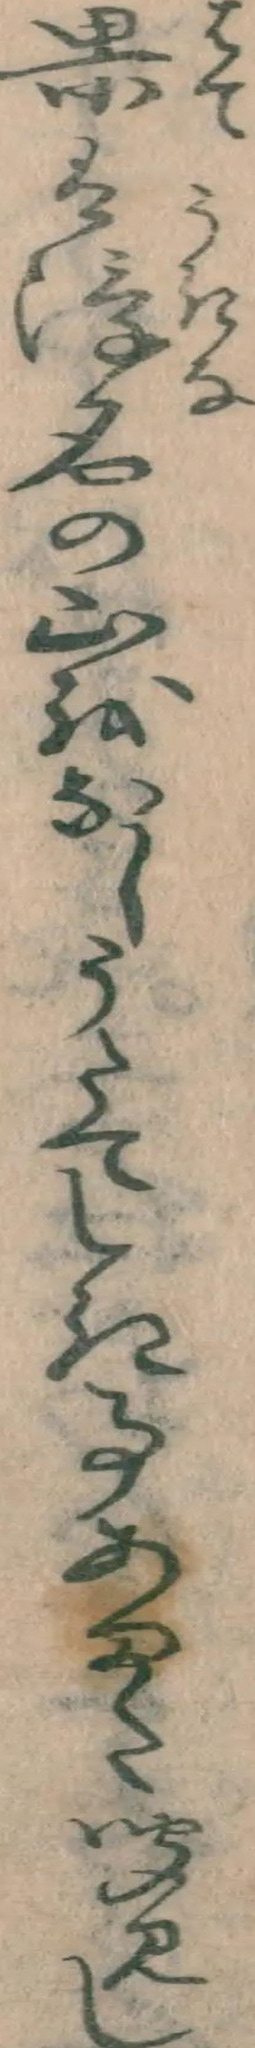果は浮名の山をなしうたてしき事あまた聞見し
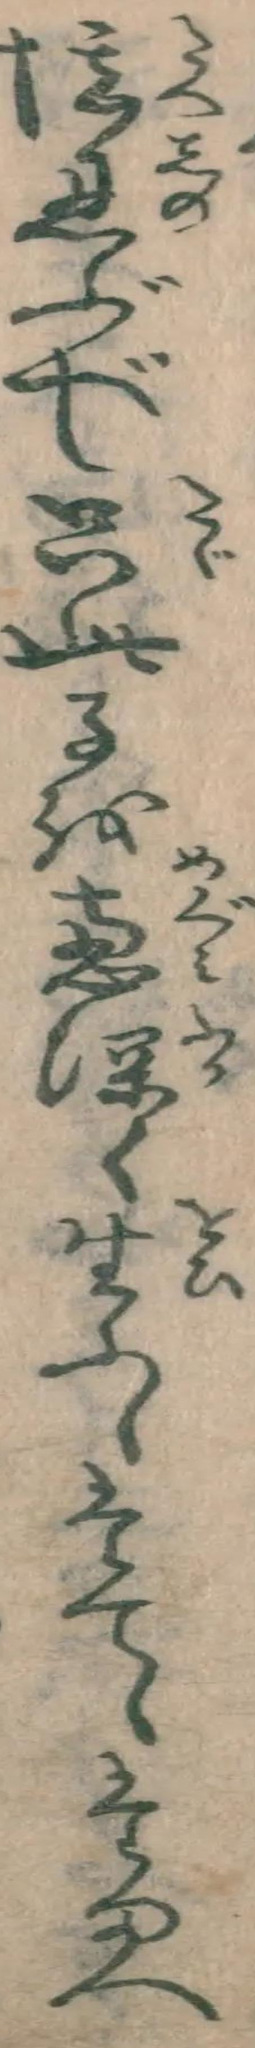堪忍ぶべし只此子を恵深く生ふしたてゝたまへ
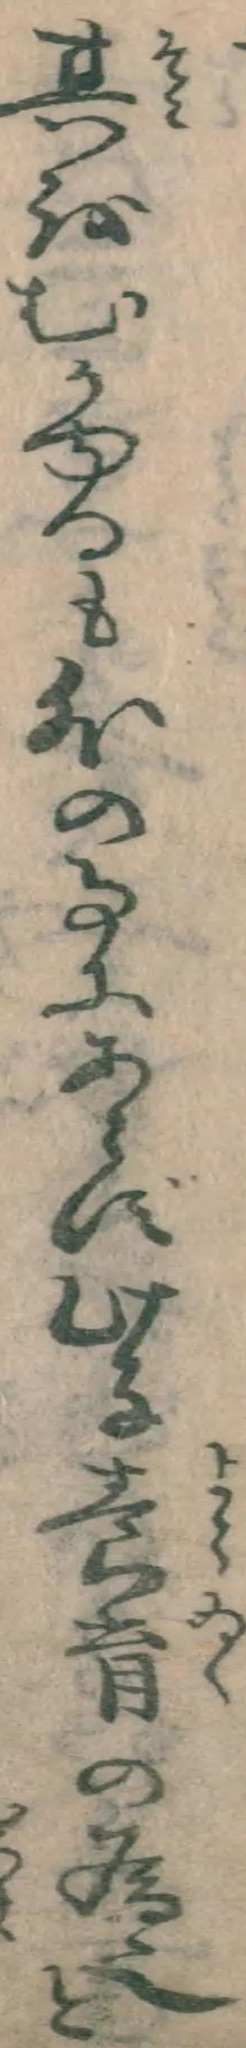其をむかゆるも外の事にあらず此子養育の為也と
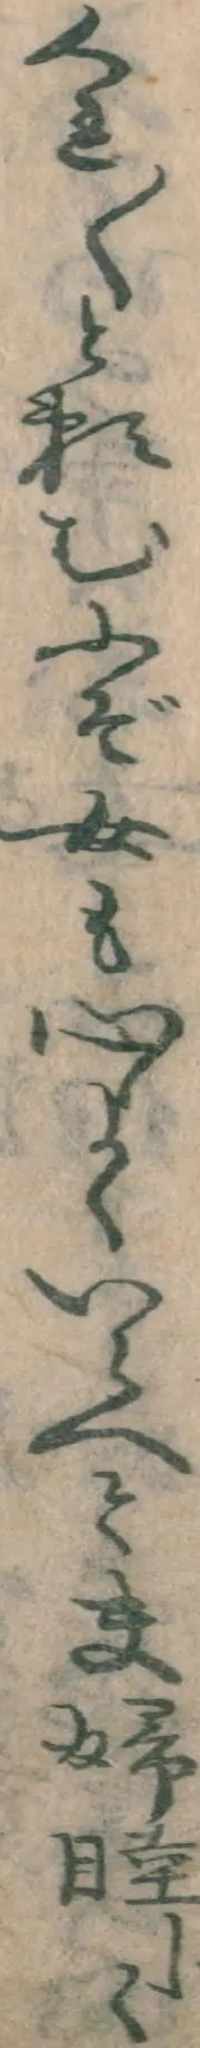くれ〳〵と頼むにぞ女も心よくいらへて夫婦睦じく
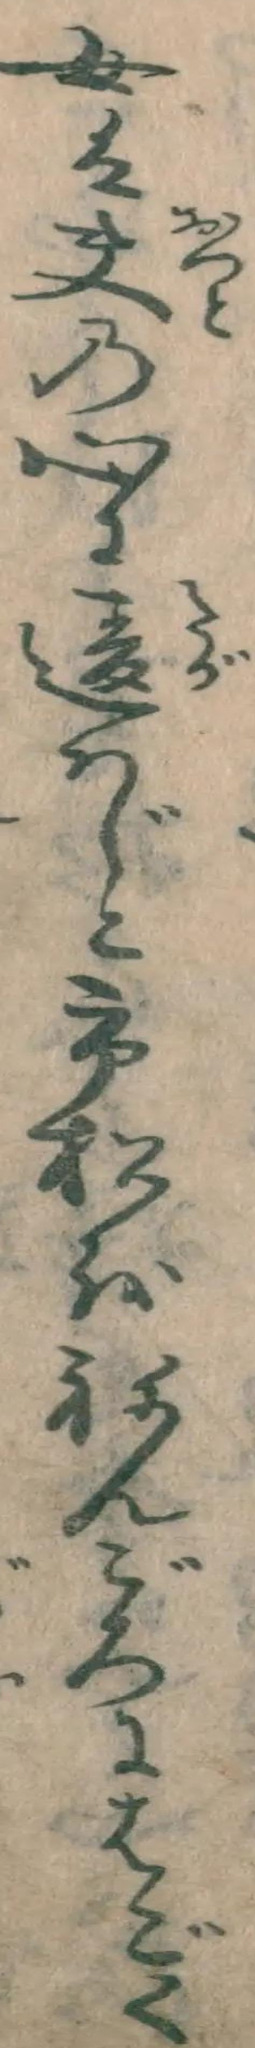女は夫の心に違はじと市松をねんごろにはごく
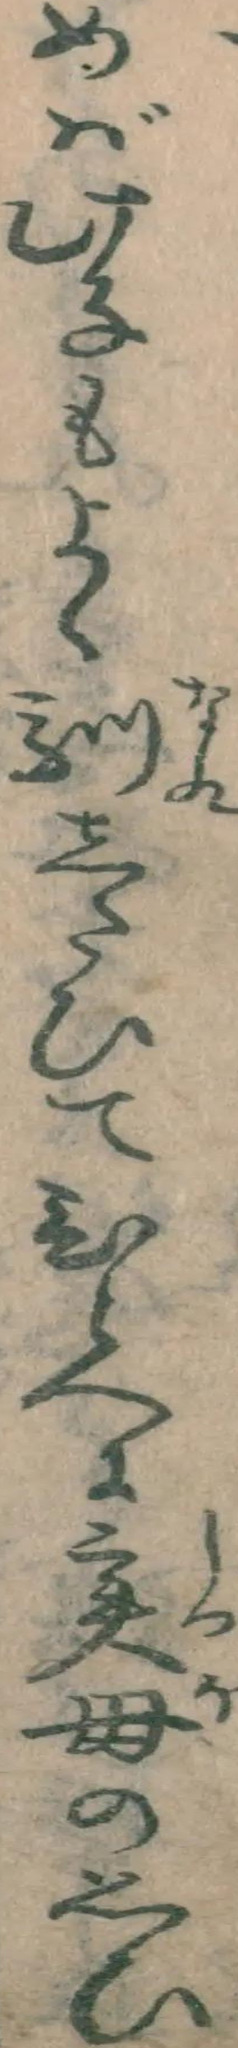めば此子もよく馴したひてひとへに実母の思ひ

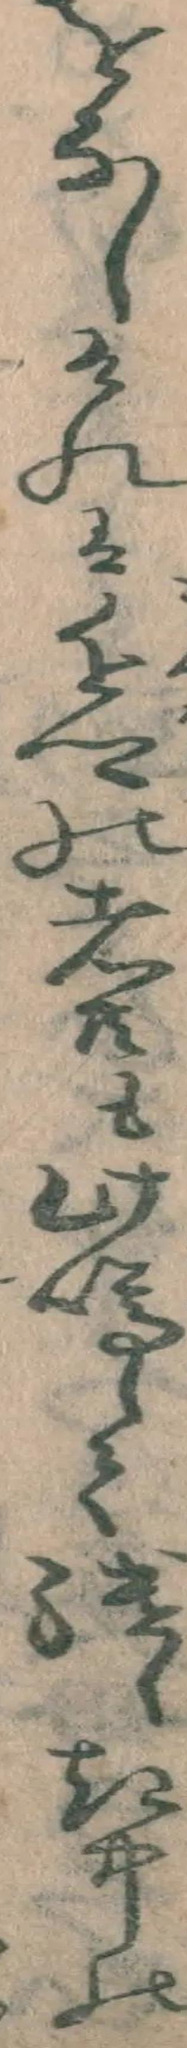をなしけれは近郷の者共も此噂して継しき中の
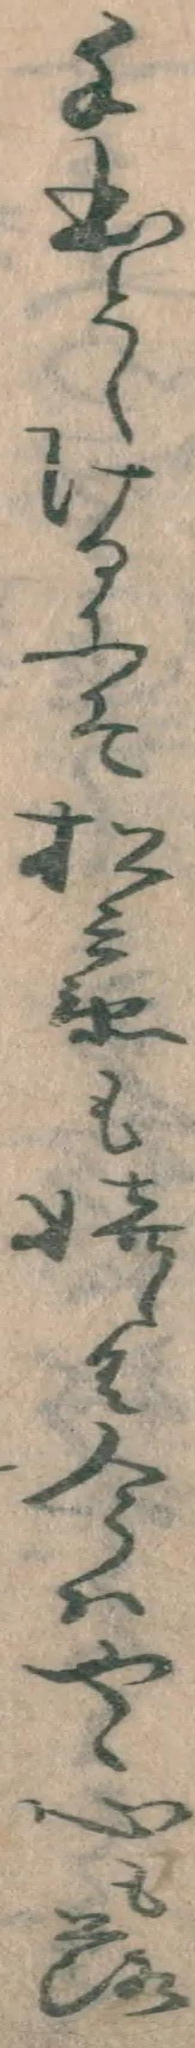手本としけるにそ松兵衛も嬉しく今はやゝ心も落
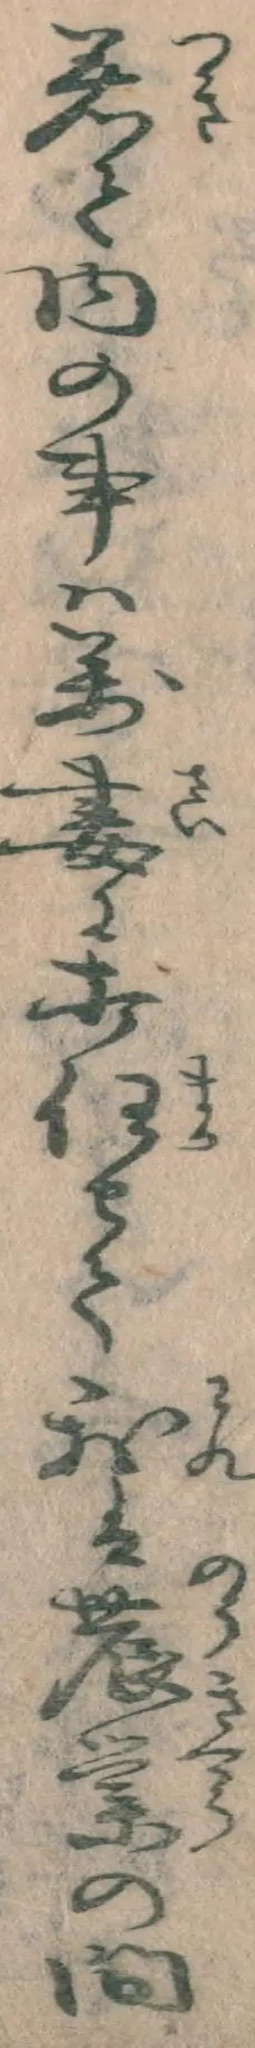着て内の事は万妻に打任せて我は農業の間
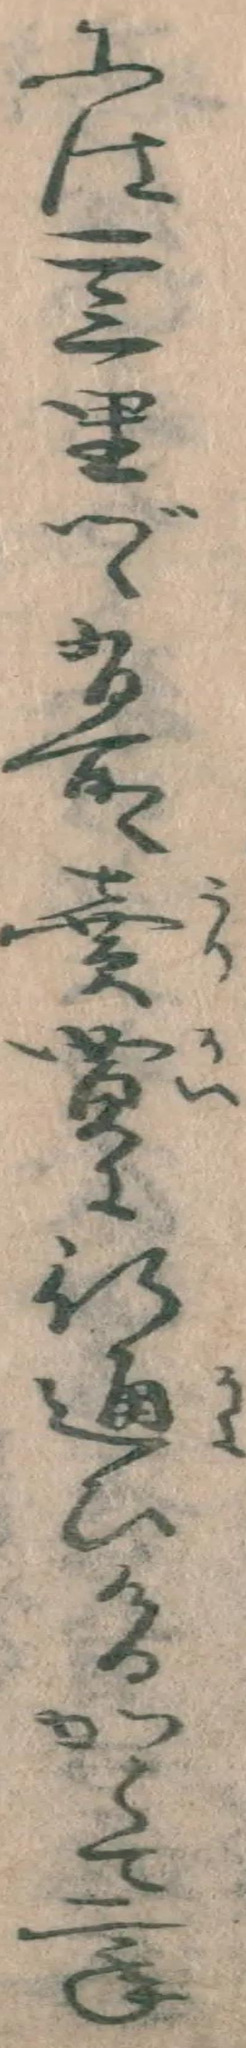には二三里づゝ有所へ売買に行通ひけるかくて二年
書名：怪談御伽童 5巻. [1]
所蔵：国立国会図書館 National Diet Library, JAPAN
